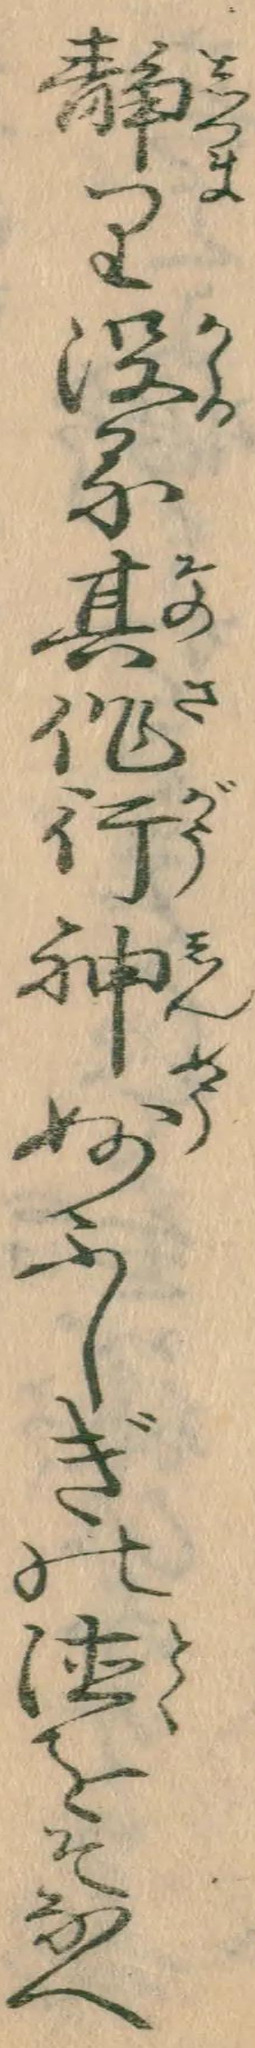静り没る其作行神妙ふしぎの徳をそなへ
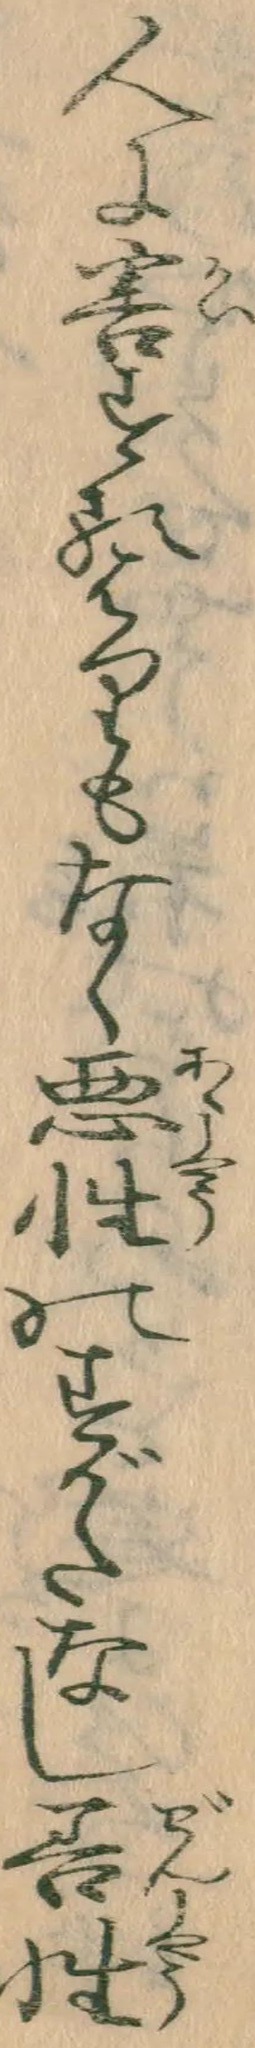人に害するはりもなく悪性のすがたなし善性
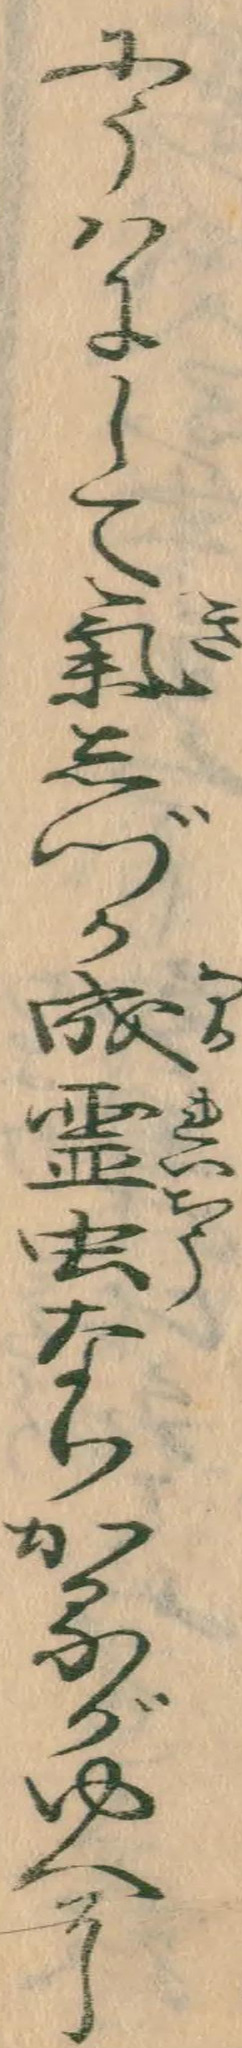にうはにして気しづか成霊虫なりかるがゆへに
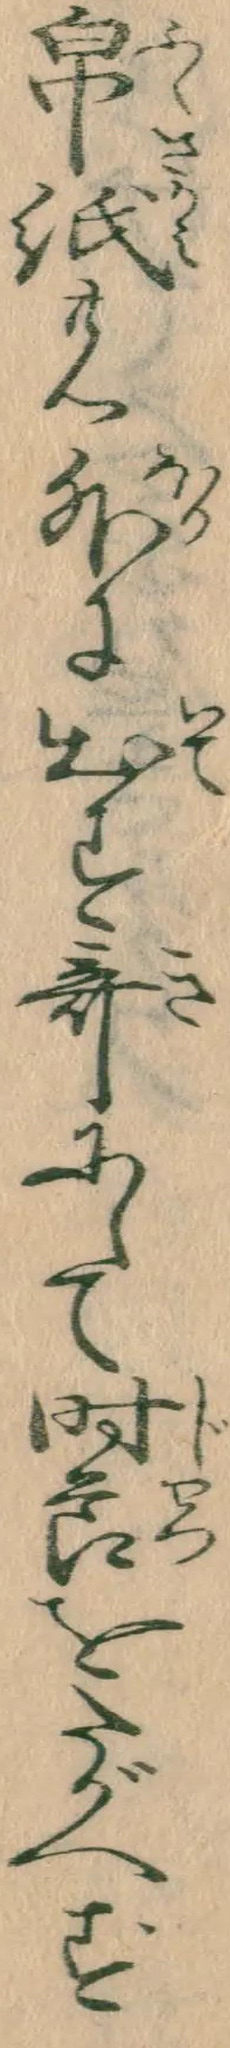帛紙の外に出す奇にして時節をたがへず
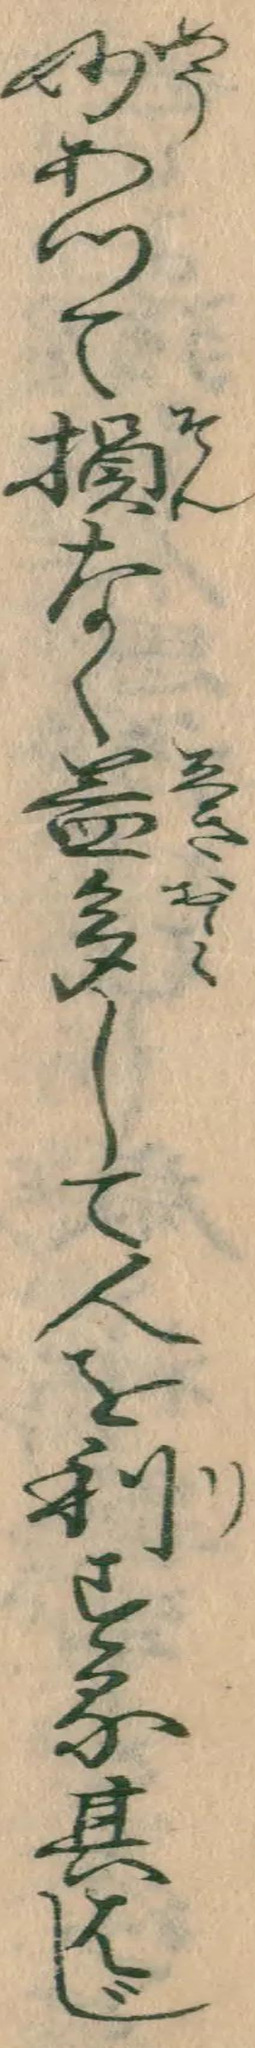妙あつて損なく益多して人を利する其はじ
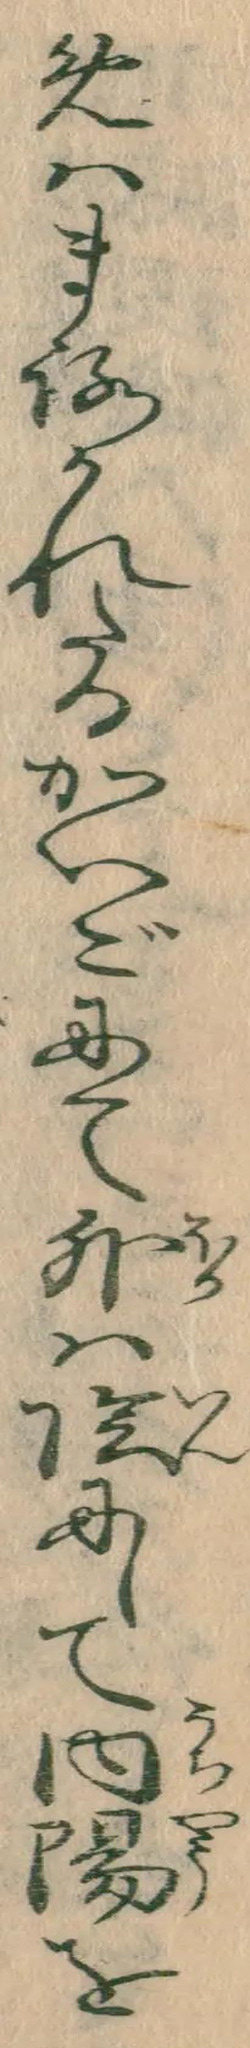めはまろかれたるかいごにて外は陰にして内陽を
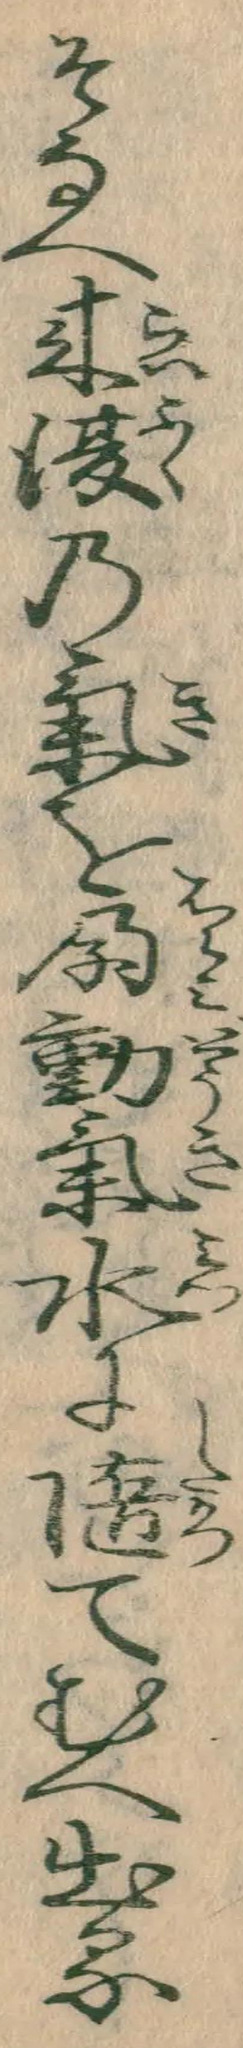そなへ来復の気を孕動気水に随てむへ出る
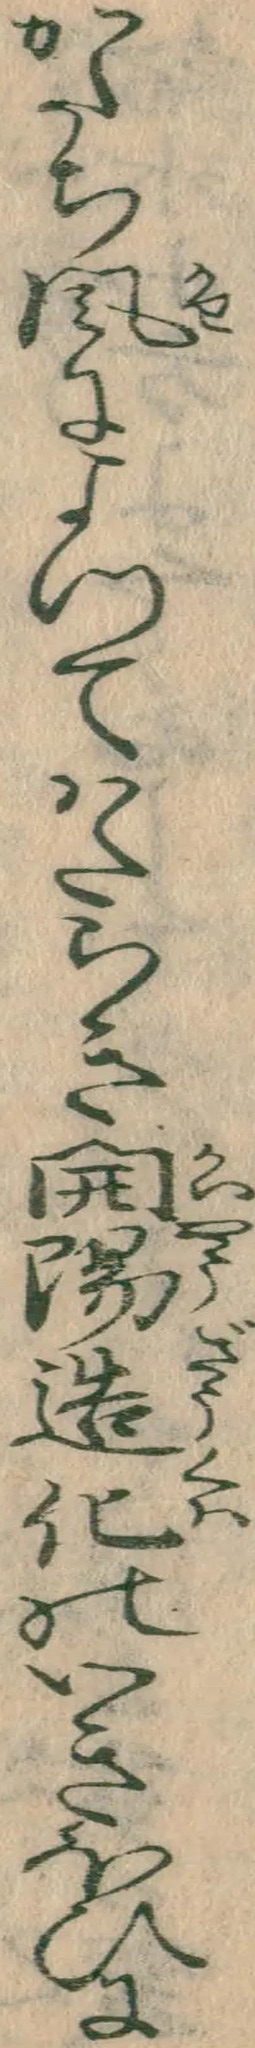かたち風によつてはたらき開陽造化のいきほひに
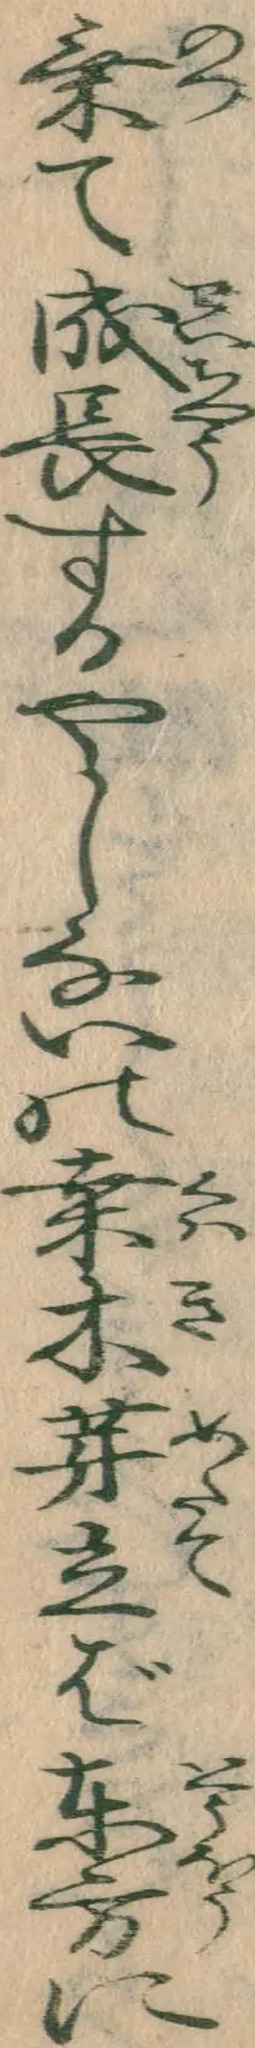乗て成長するやしないの桑木芽立ば東方に
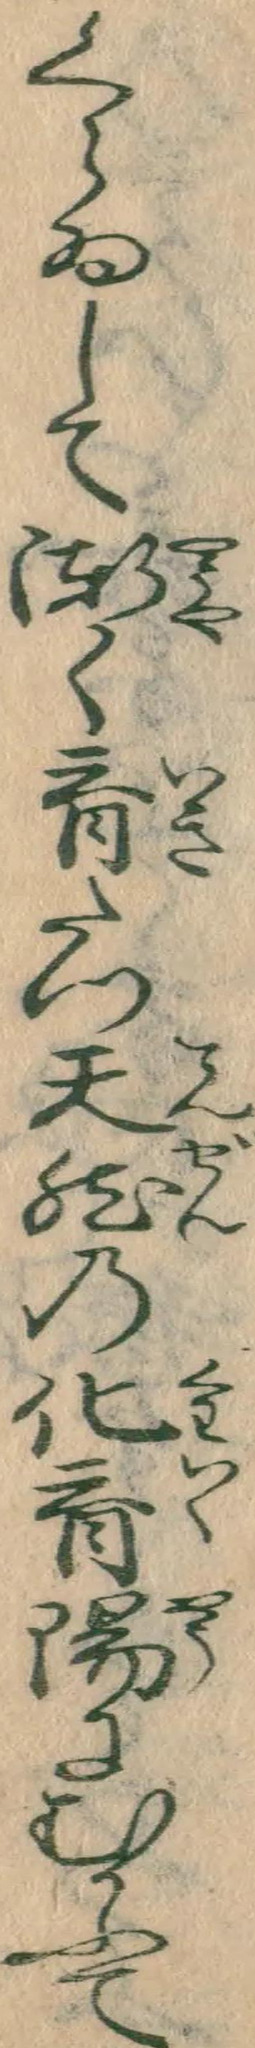くらゐして漸く育たつ天然の化育陽にむかふて
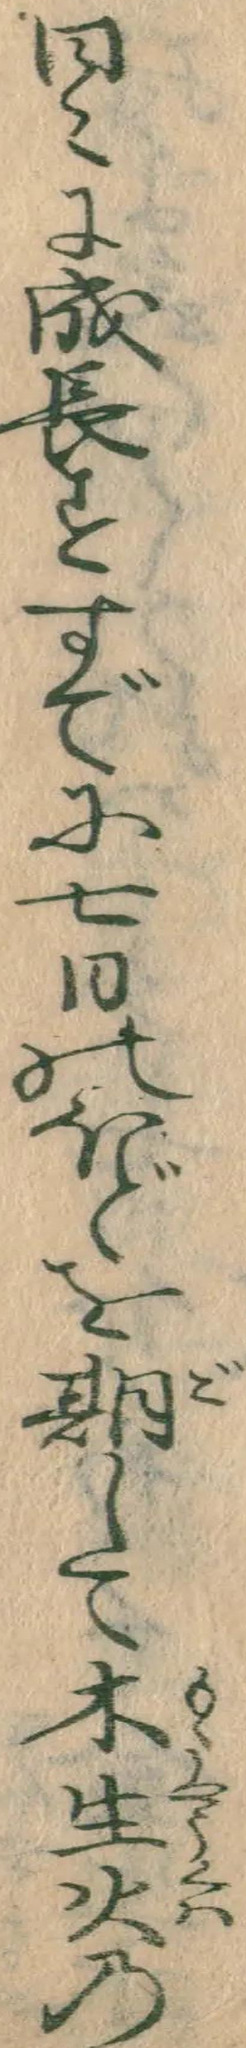日々に成長すすでに七日のほどを期して木生火の
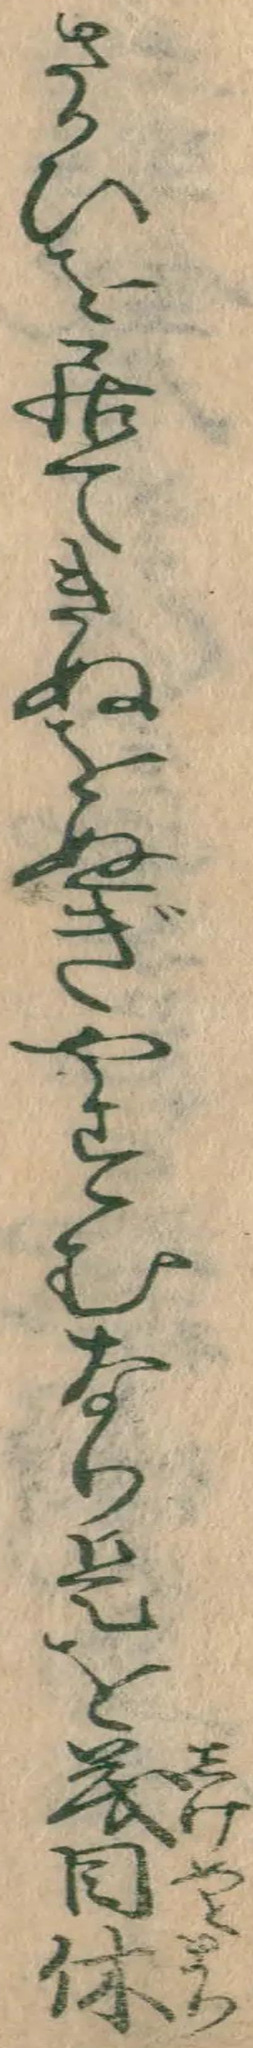さかひを居てきぬをぬぎやすむなり是を茂目休
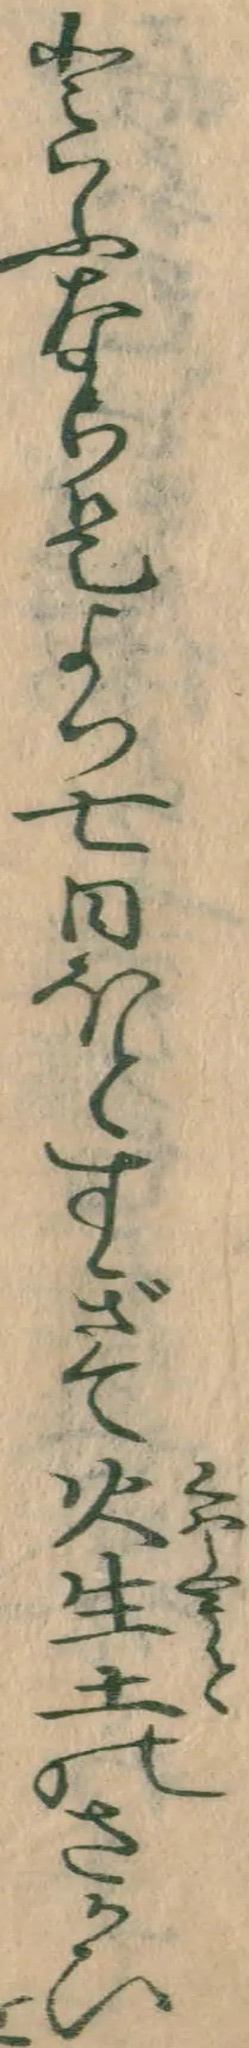といふなり是より七日ほとすぎて火生土のさかひを

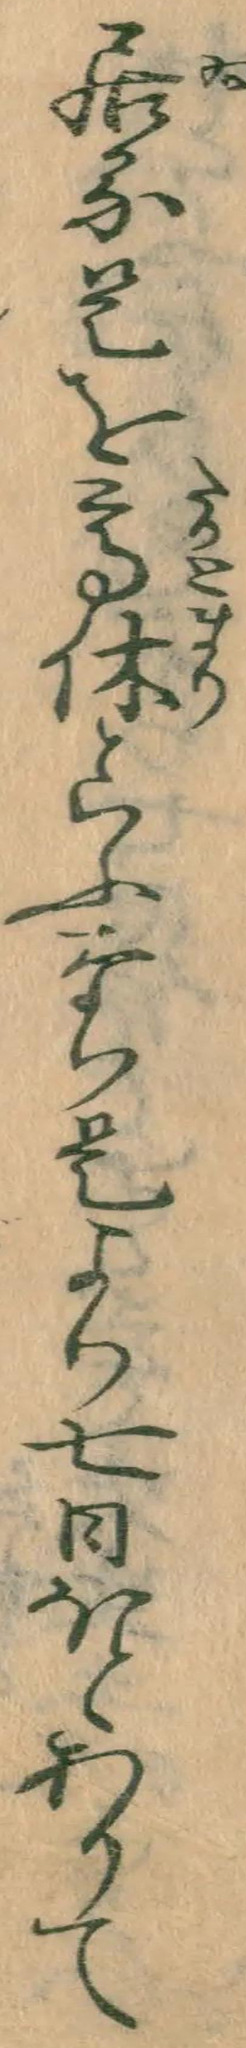居る是を高休といふなり是より七日ほとありて
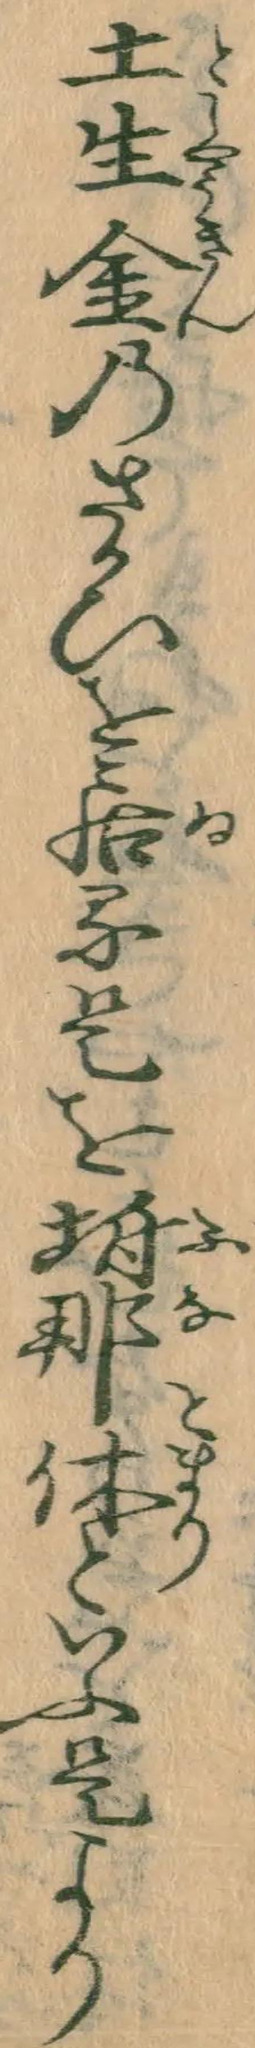土生金のさかひを居る是を坿那休といふ是より
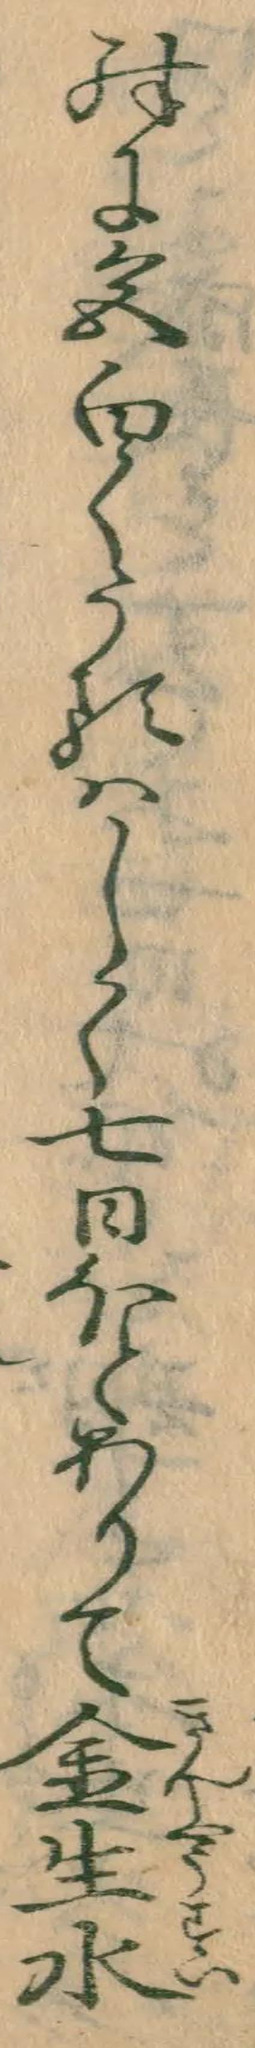殊に色白くうるはしく七日ほとありて金生水
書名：蚕飼養法記
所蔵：国立国会図書館 National Diet Library, JAPAN
